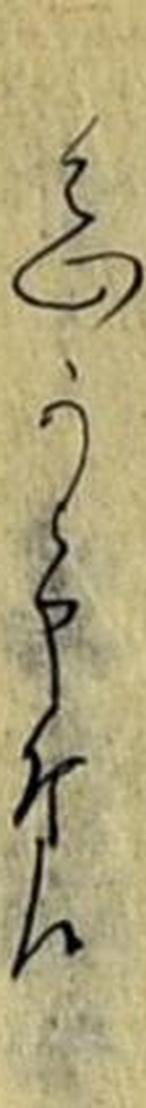念可被申付候
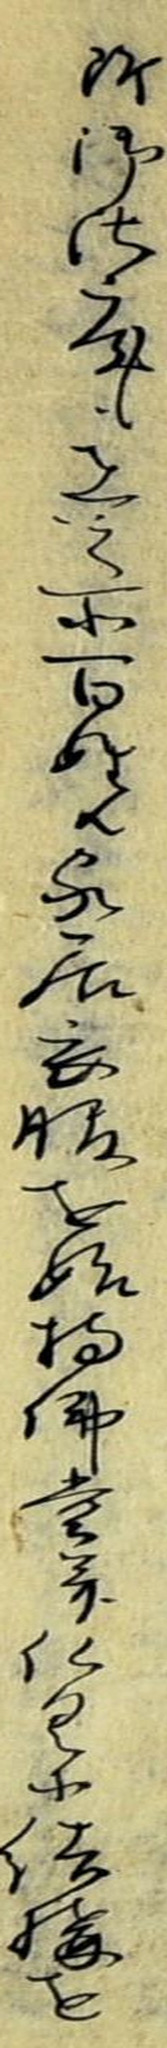付御法度も在之所百姓共家居衣服を始持仏堂并仏具等結構を

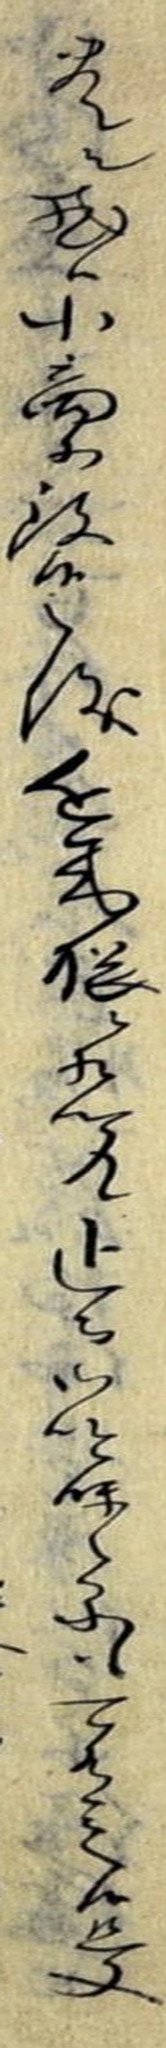尽シ或ハ小商等致候之儀近来猥ニ相聞候追而御吟味之品も可有之候且又
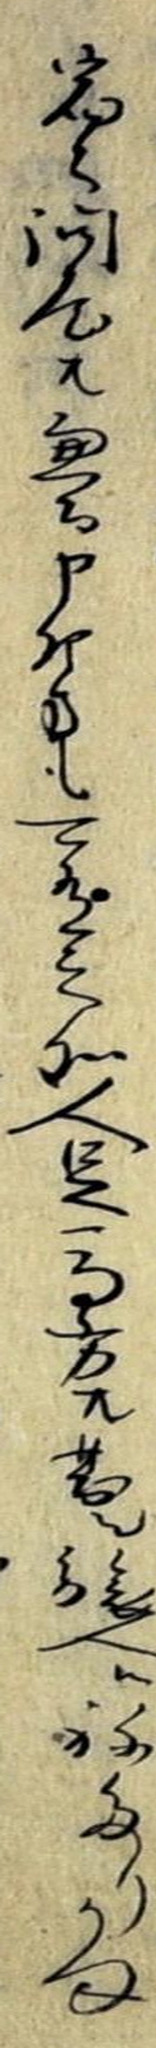宿々問屋共兼而申付方も可有之処人足馬方共対シ旅人江ねたりかま
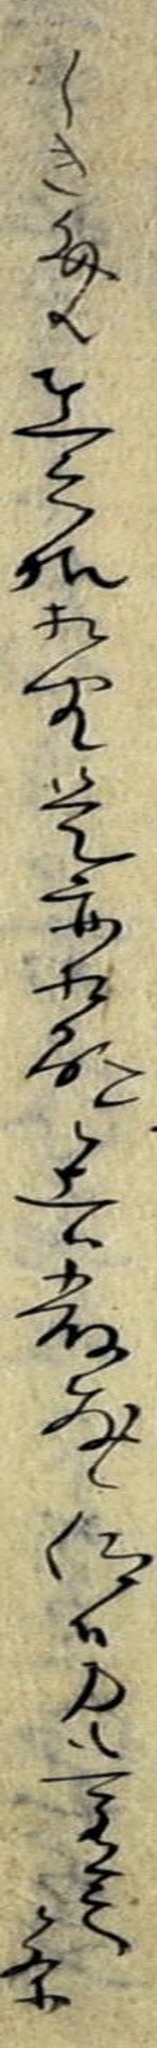しき義共在之様相聞候是亦相顕レ候上ハ厳敷被仰付方も可有之候条
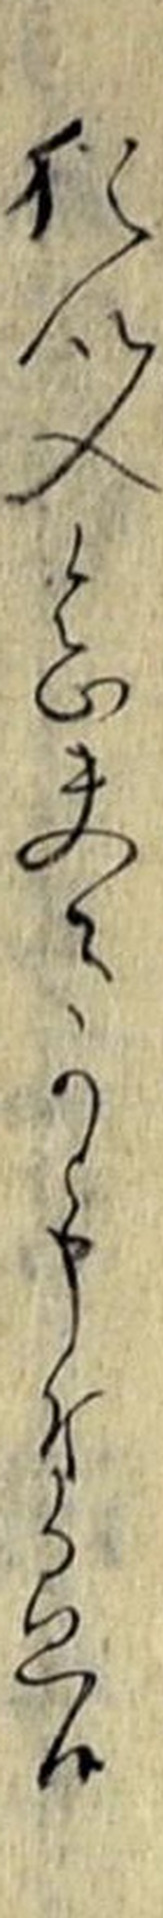猶以入念夫々可被申付置候
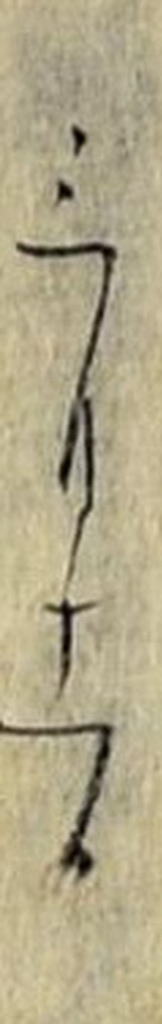三月十一日
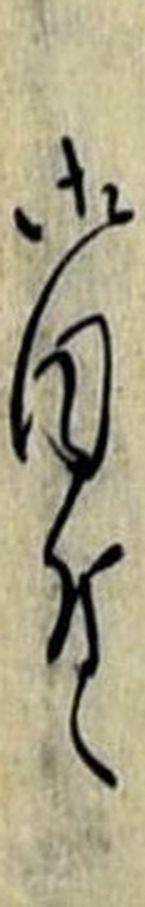御目付へ
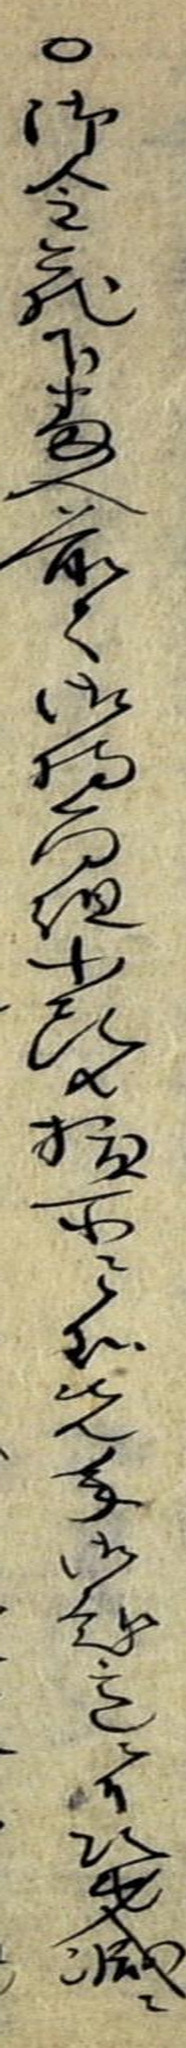〇御金蔵下番人前々御持筒組小頭共抜所ニ候処先年御趣意ニ付次第減ニ
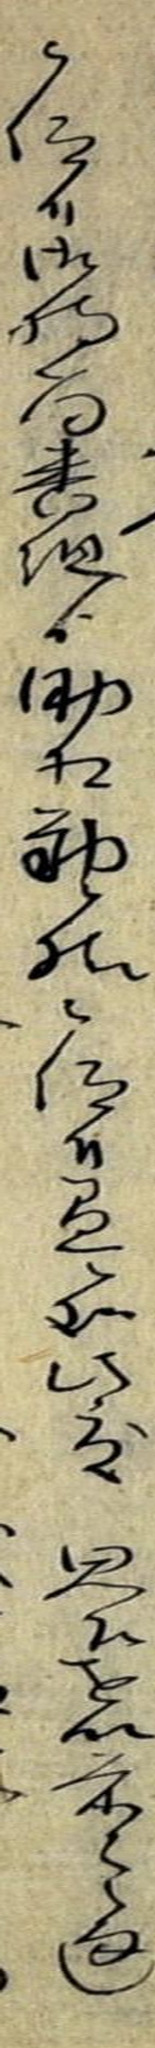被仰付御持筒番組ゟ助相勤候様被仰付置候処此度思召を以前々之通
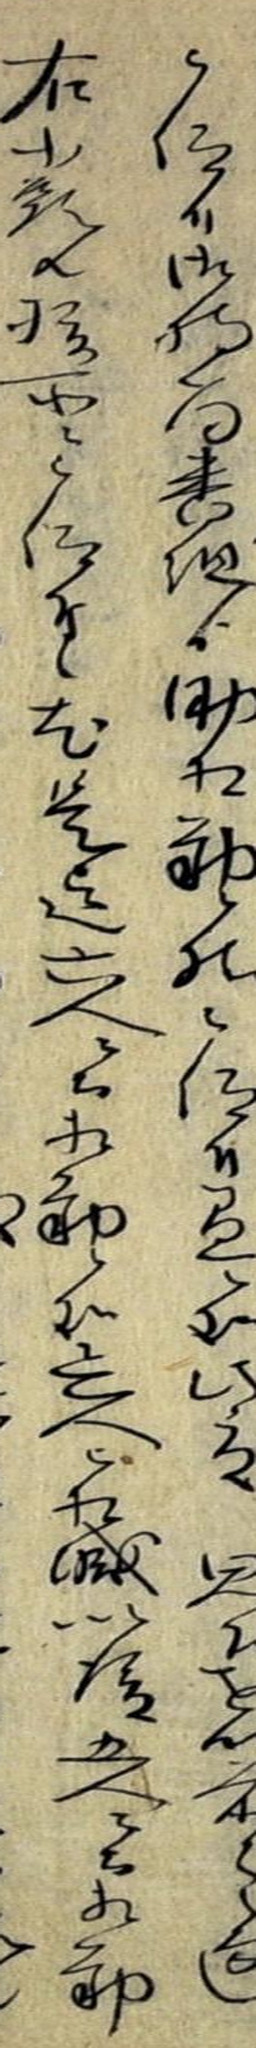右小頭共抜所ニ被仰付候尤是迄六人二而相勤候処壱人被相減以後五人ニ而相勤
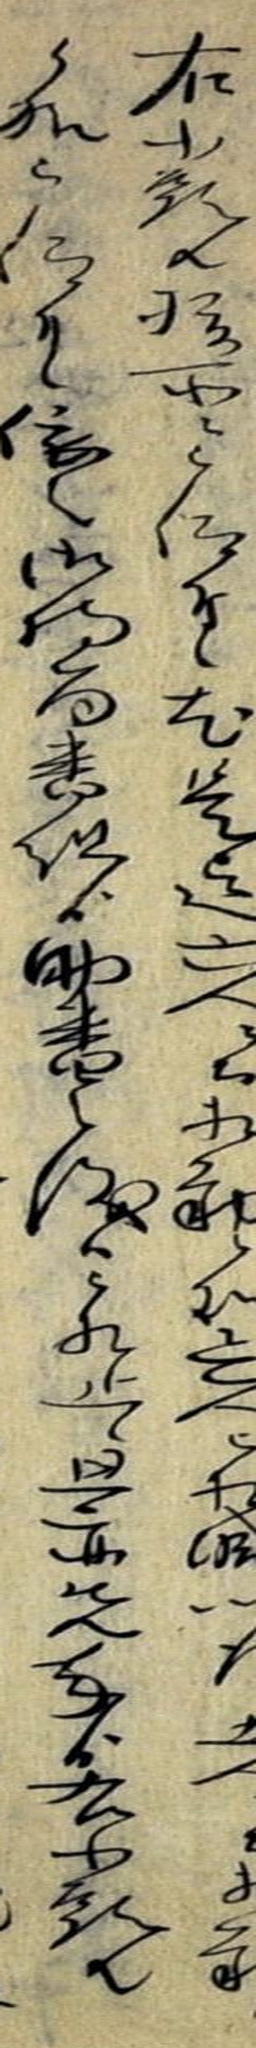候様被仰付候依之御持筒番組ゟ助番之儀ハ被相止候且亦先年ゟ右小頭共
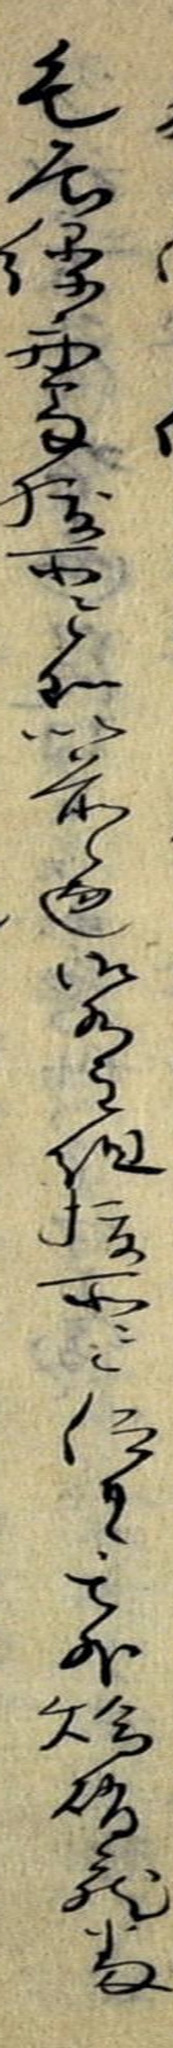毛屋繰舟番抜所ニ候処以前之通御水主組抜所ニ被仰付候其外焔硝蔵番
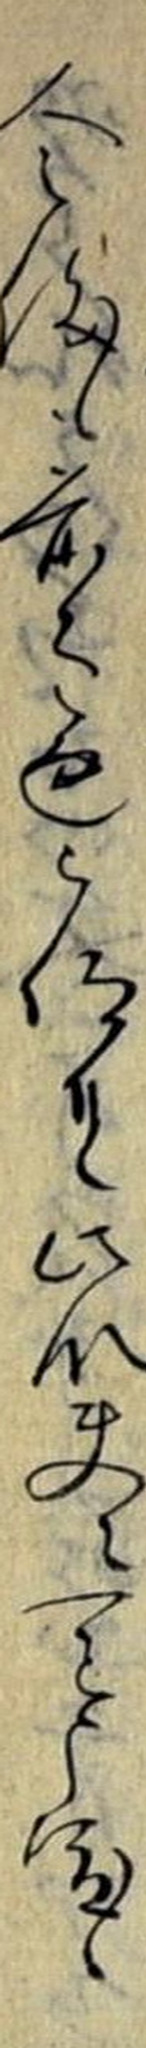人之儀も前々之通被仰付候此段夫々可被申渡候
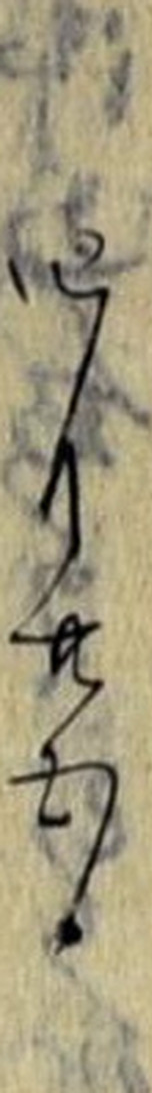四月廿五日
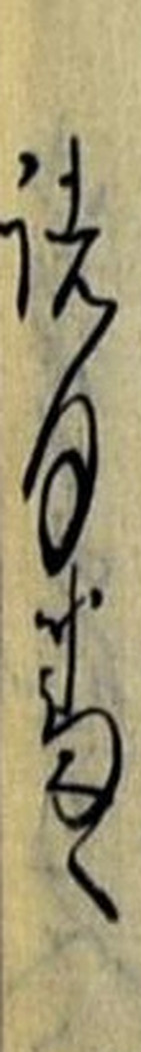諸月番へ
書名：命令之部 三
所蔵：福井県文書館 Fukui Prefectural Archives
